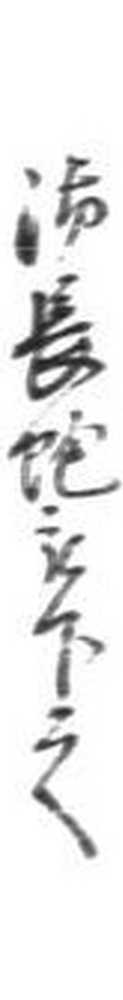御長蚫被下之
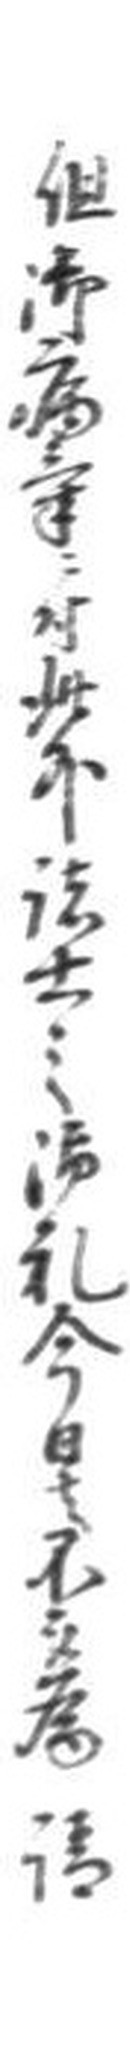但御病気ニ付此外諸士之御礼今日者不被為請

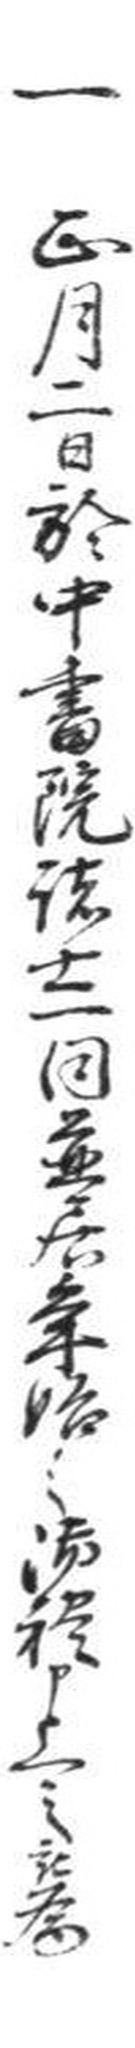一正月二日於中書院諸士一同並居年始之御礼申上之被為
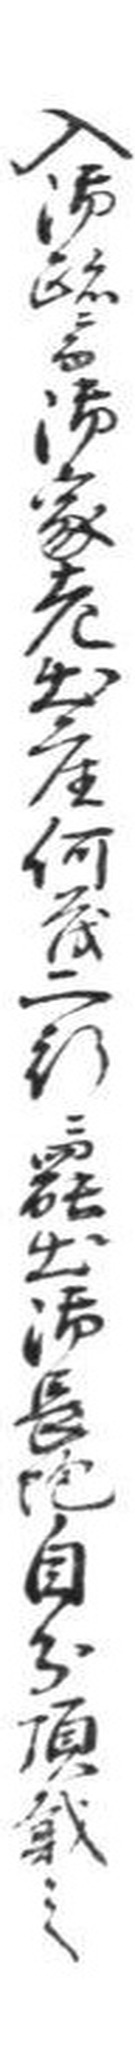入御跡ニ而御家老出座何も二行ニ罷出御長蚫自分頂戴之
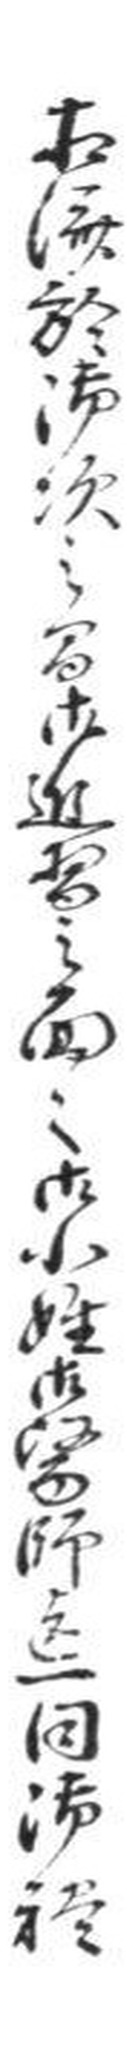相済於御次之間御近習之面々御小姓御医師迄一同御礼
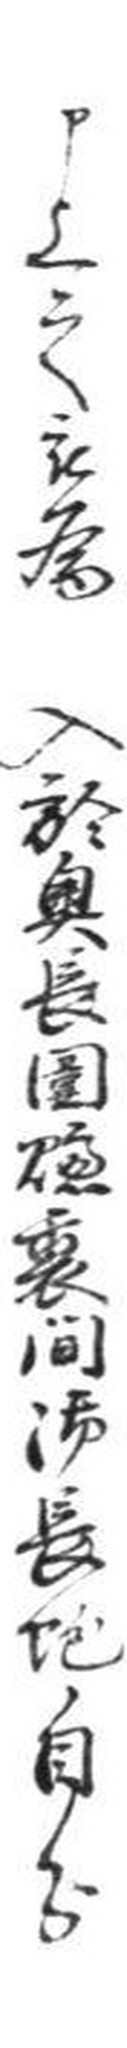申上之被為入於奥長囲炉裏間御長蚫自分
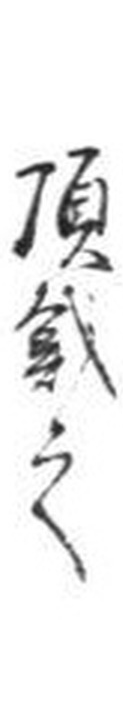頂戴之
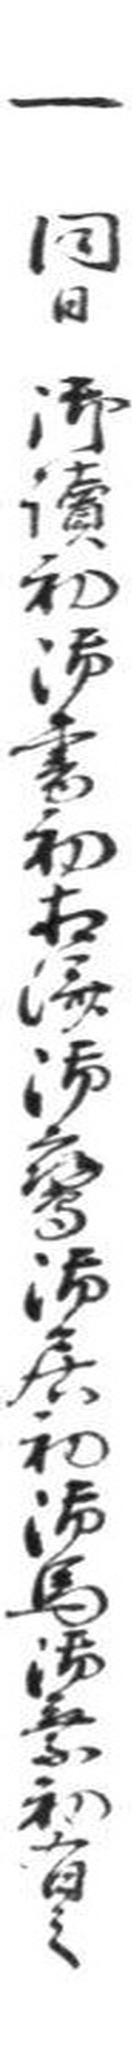一同日御読初御書初相済御鷹御居初御馬御乗初有之
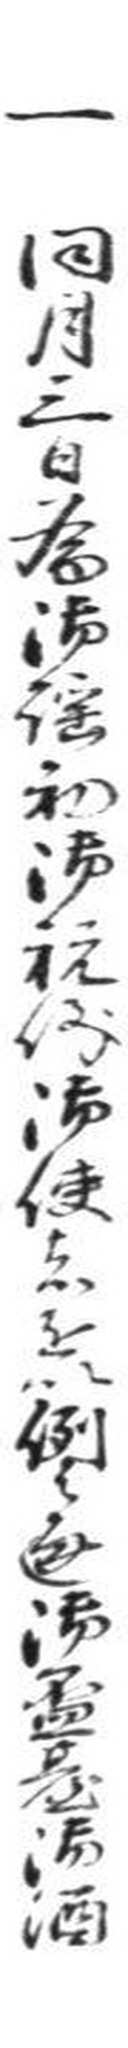一同月三日為御謡初御祝儀御使者を以例之通御盃台御酒
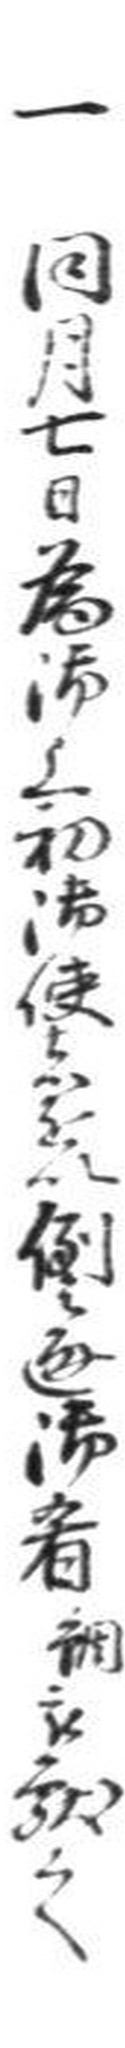一同月七日為御上初御使者を以例之通御肴鯛被献之
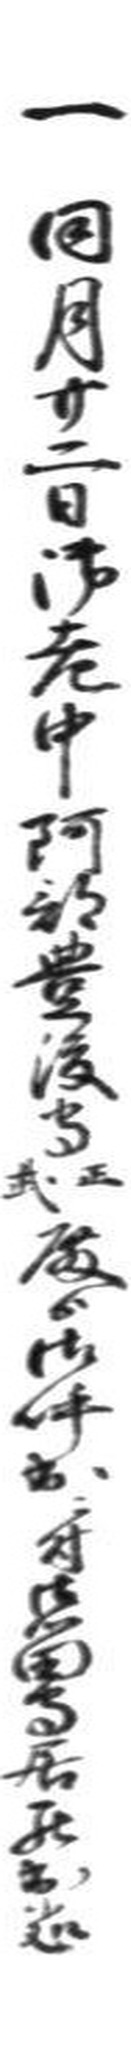一同月廿二日御老中阿部豊後守正武殿ゟ御呼出ニ付御留守居罷出候処
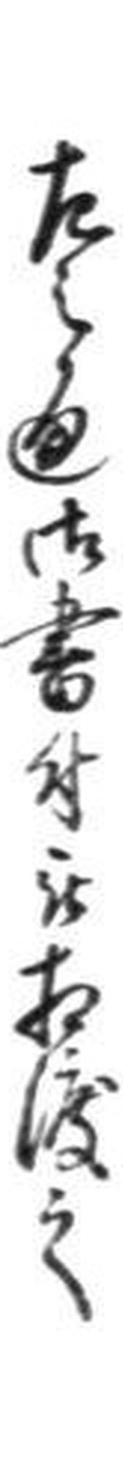左之通御書付被相渡之
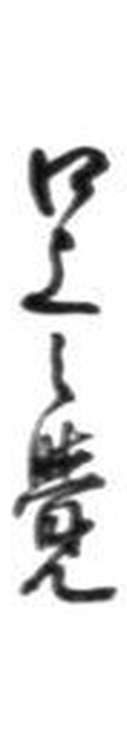口上之覚
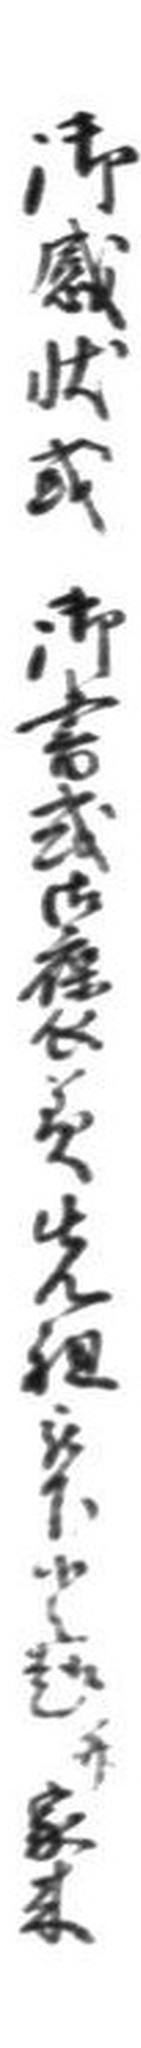御感状或御書或御褒美先祖被下候之趣并家来
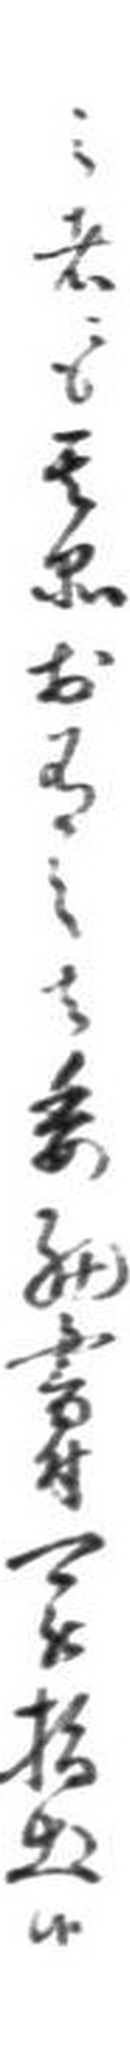之者ニも其品於有之者委細書付可被指出候
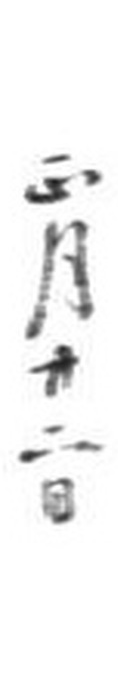正月廿二日
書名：家譜 十五 綱昌公 従天和元年到元禄十二年
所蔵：福井県文書館 Fukui Prefectural Archives
